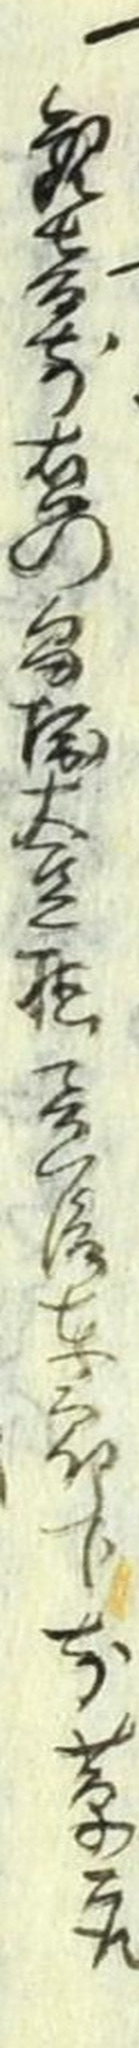観音前右の畠掘大豆植昼後東廊下前草取
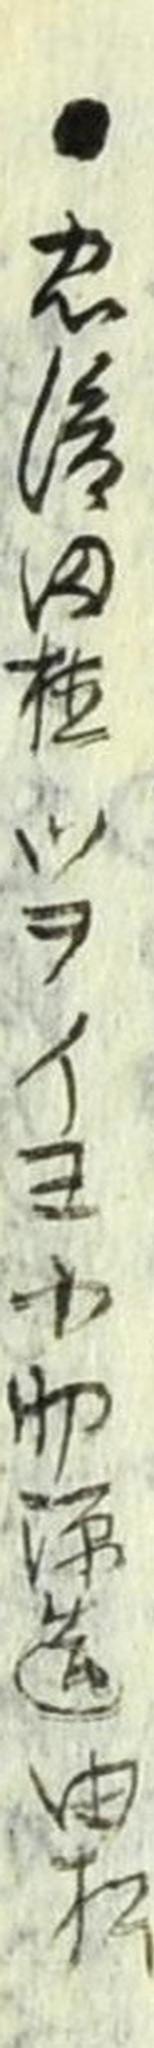●忠後田植ツヲイヨ小助源造由松
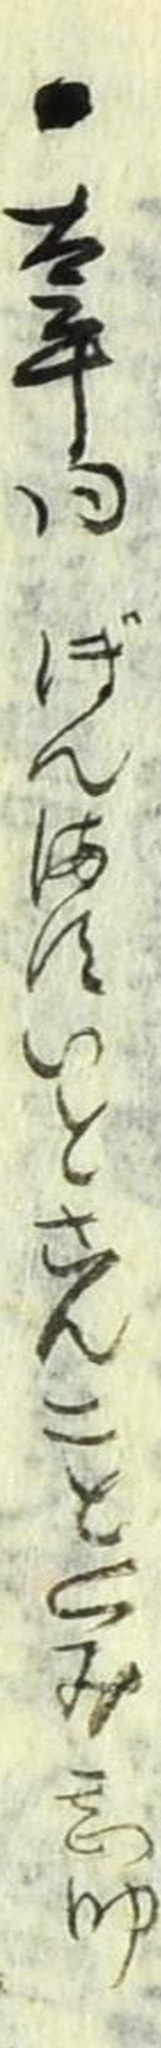●太平同ぼんますいとさんことくみ甚助
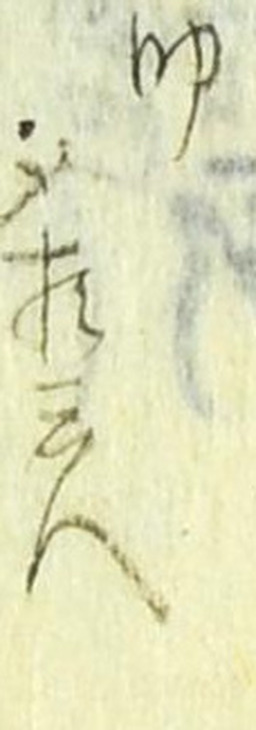〆拾三人
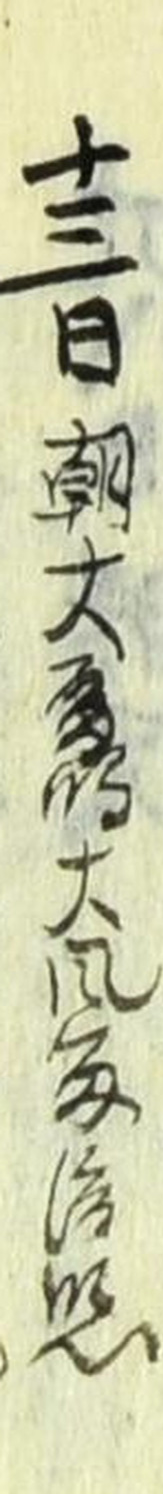十三日朝大雷鳴大風雨後照
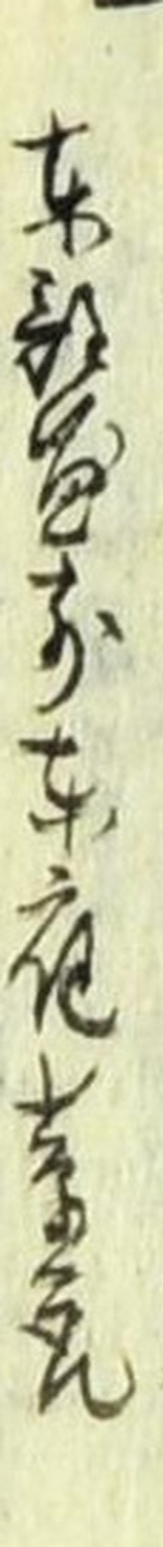東部屋前東庭草取
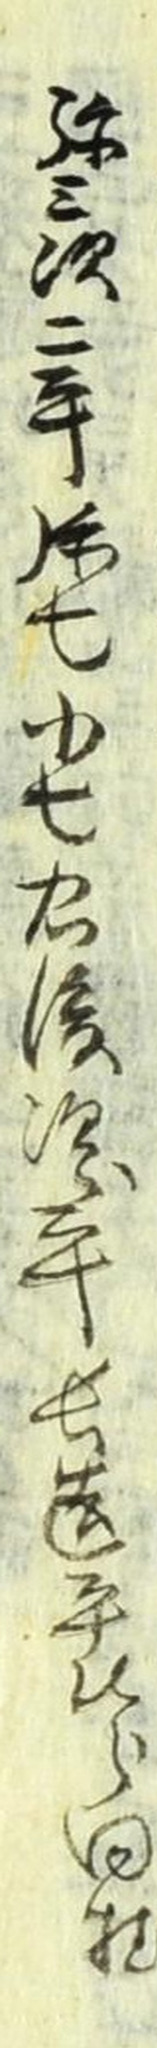弥三次二平弥七小七忠後次郎平長造平次郎田植
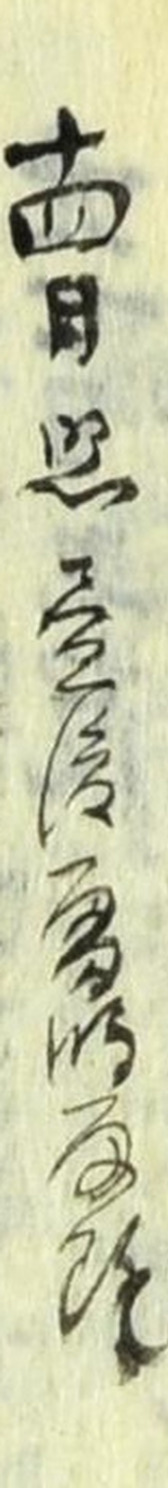十四日照昼後雷鳴雨降
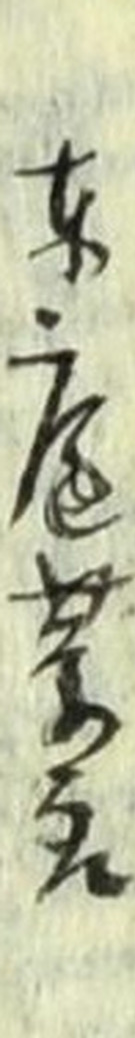東庭草取
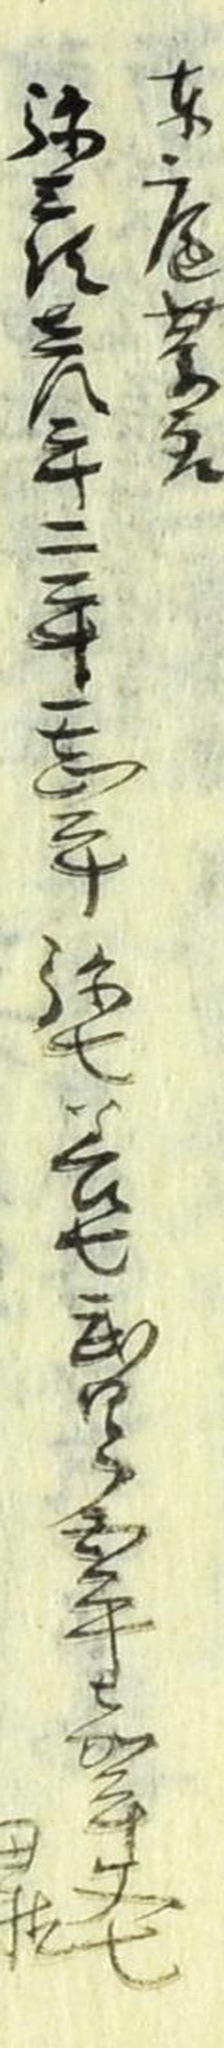弥三次彦平二平甚平弥七善七武四郎五平嘉平文七
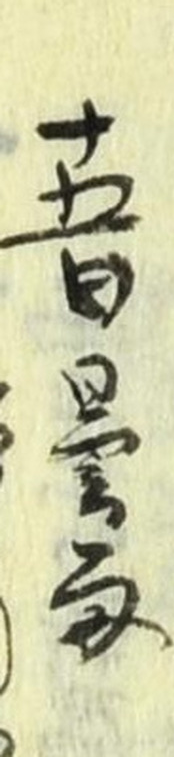十五日曇雨
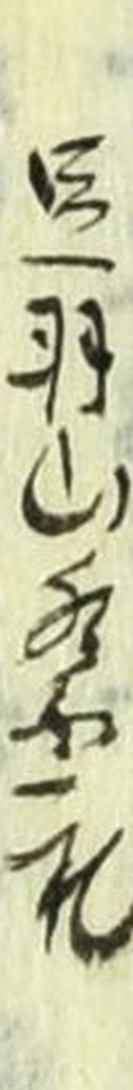足羽山祭礼
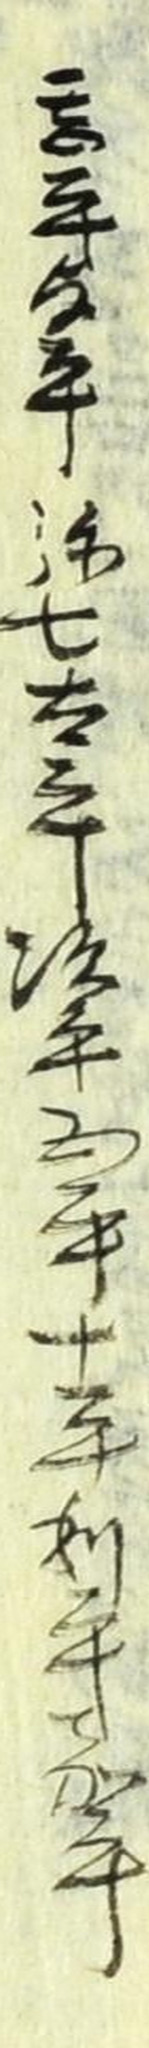甚平与平弥七太平次平五平十平利平嘉平
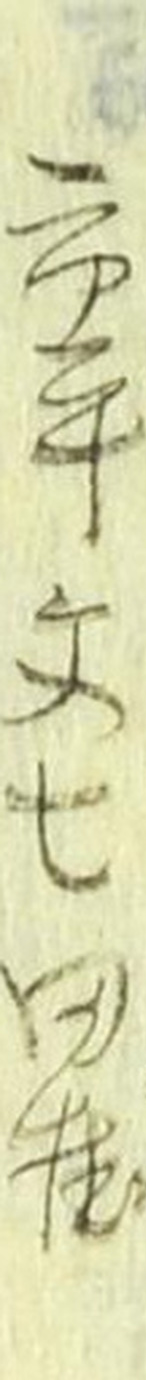市平文七田植
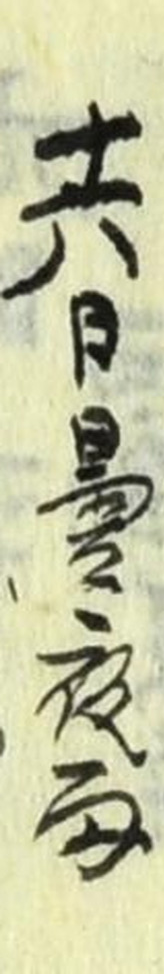十六日曇夜雨
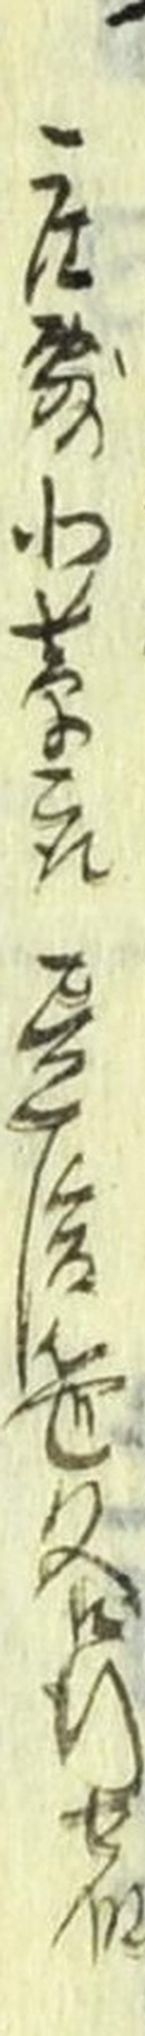座敷北草取昼後笹谷行宿
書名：（日記）
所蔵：福井県文書館 Fukui Prefectural Archives
